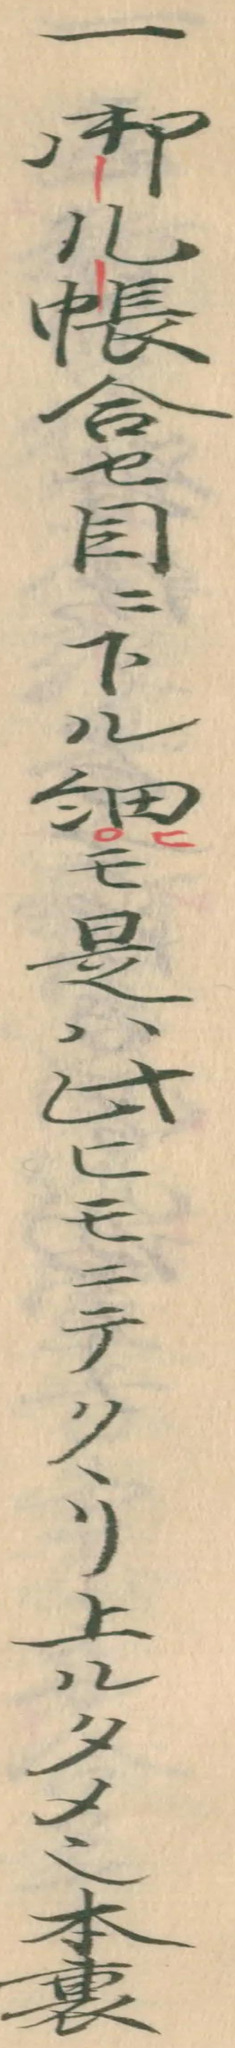一御-几-帳合セ目ニ下ル細￮モ是ハ此ヒモニテクヽリ上ルタメ也本裏
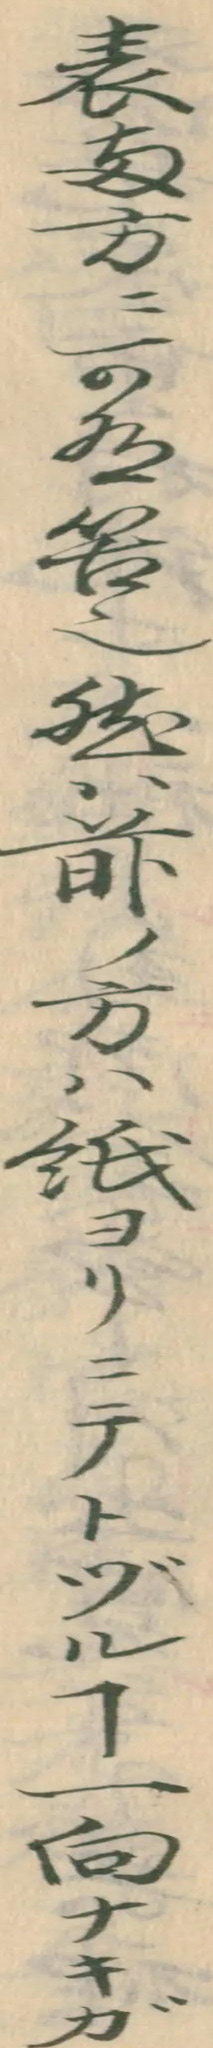表両方ニ可有筈也然ハ前ノ方ハ紙ヨリニテトヅルコト一向ナキガ
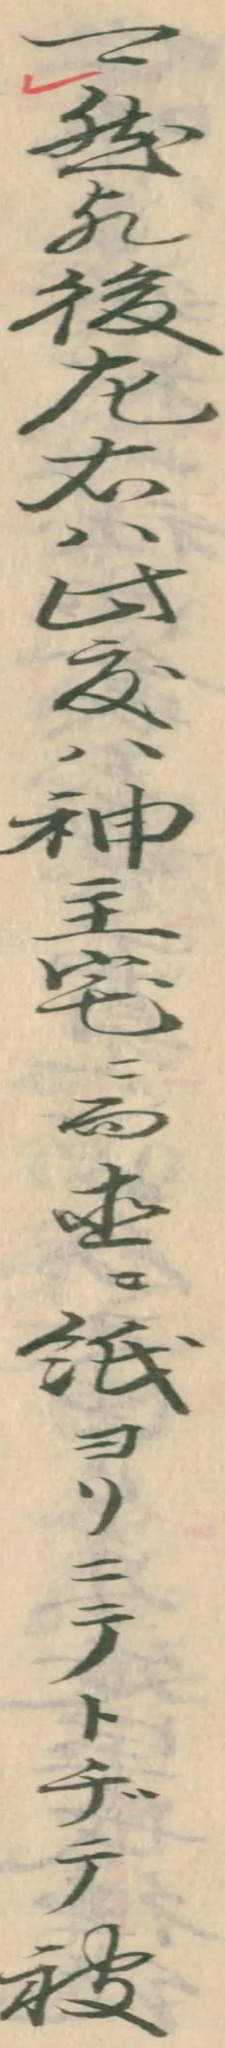可然歟後左右ハ此度ハ神主宅ニ而直ニ紙ヨリニテトヂテ被
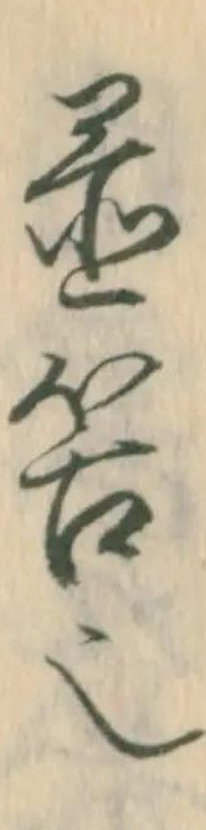置筈也
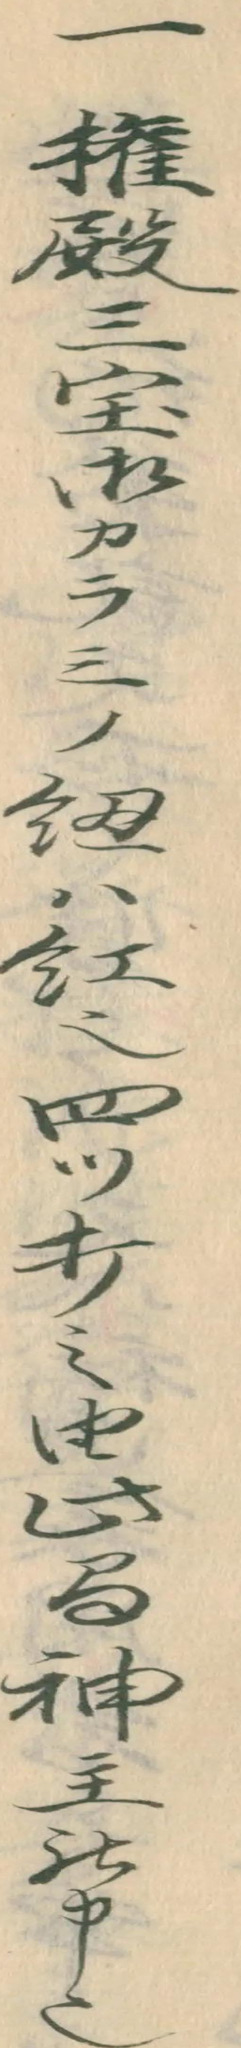一権殿三宝御カラミノ紐ハ紅也四ツ打之由此間神主被申也
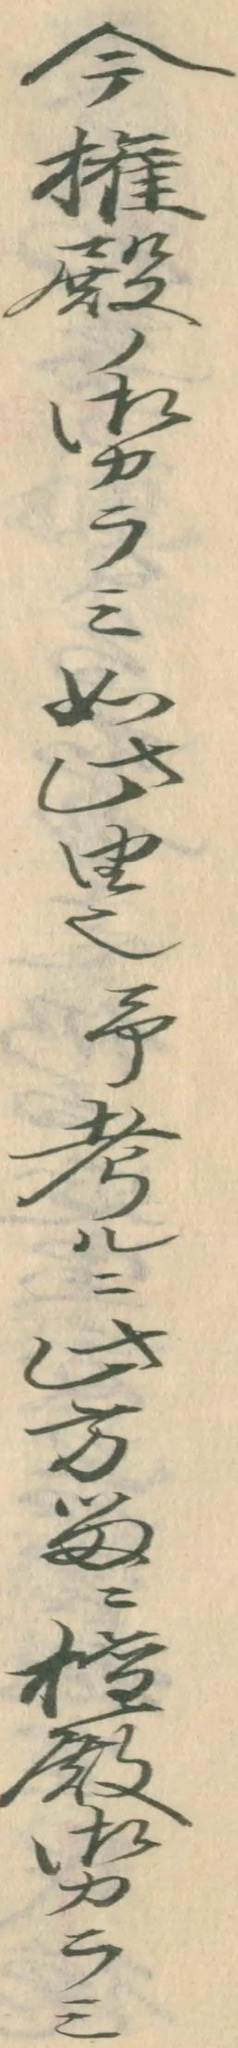今権殿ノ御カラミ如此由也予考ルニ此方留ニ権殿御カラミ
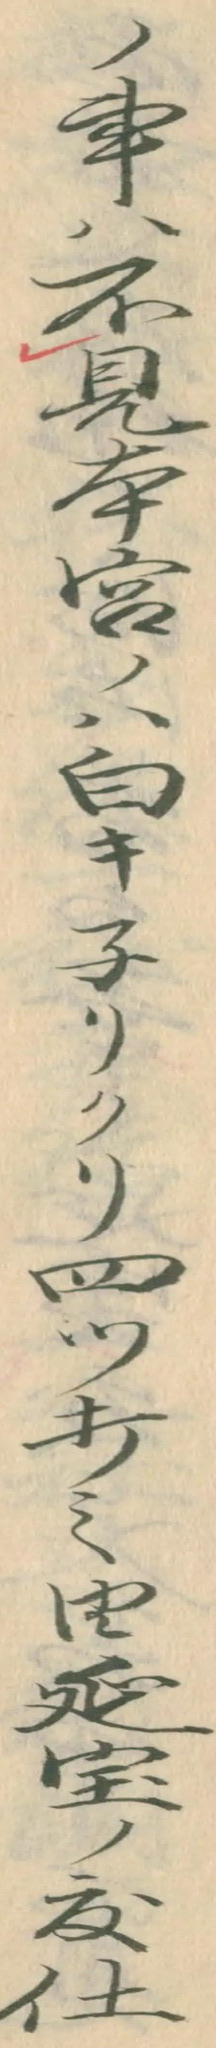ノ事ハ不見本宮ノハ白キネリクリ四ツ打之由延宝ノ度仕
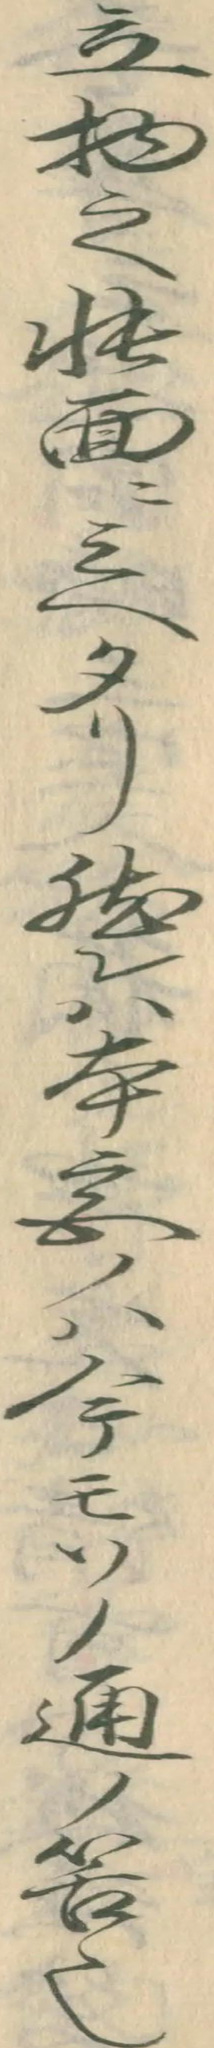立物之帳面ニミへタリ然レハ本宮ノハ今モソノ通ノ筈也

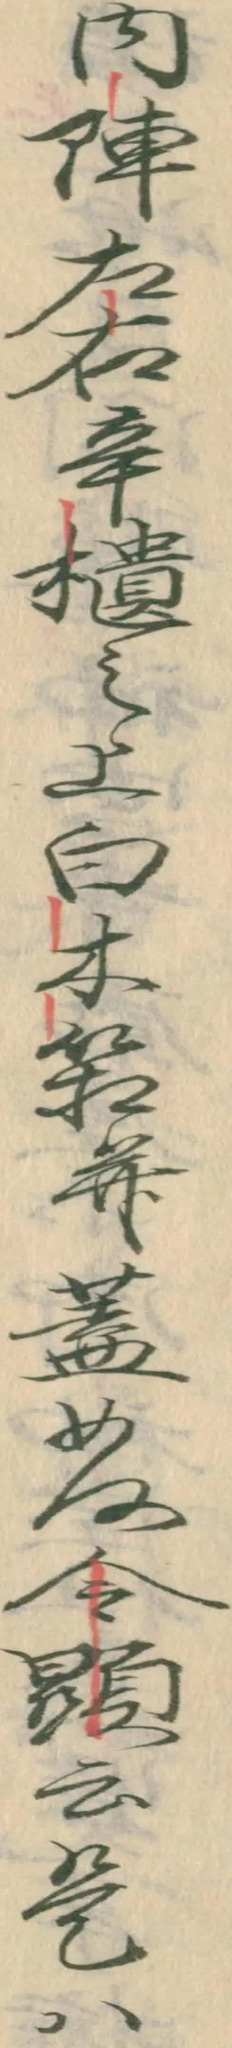内-陣左-右辛_櫃之上白_木_箱并蓋如何令顕云是ハ
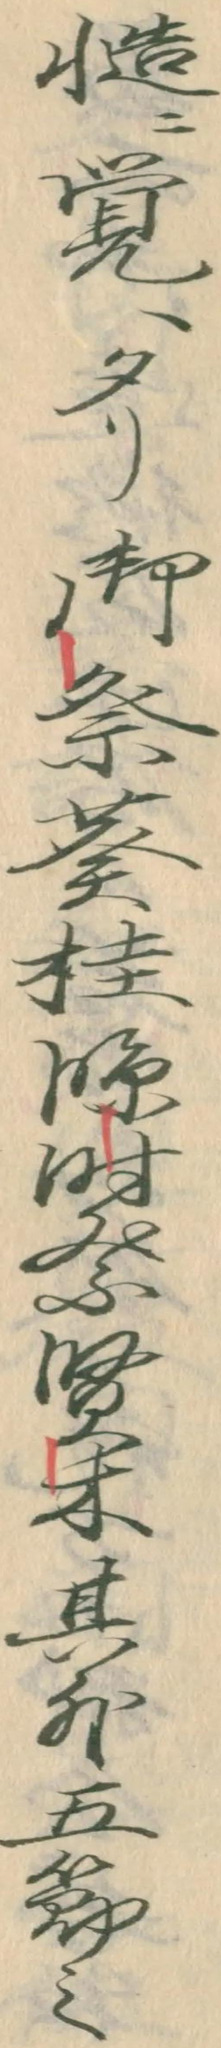慥ニ覚ヘタリ御_祭葵桂臨-時祭賢_木其外五節之

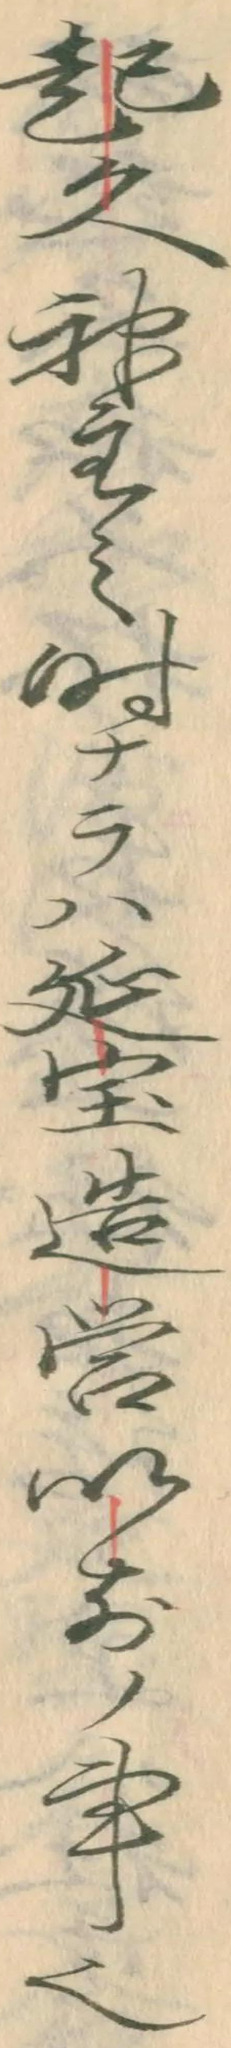起久神主之時ナラハ延-宝造-営以-前ノ事也
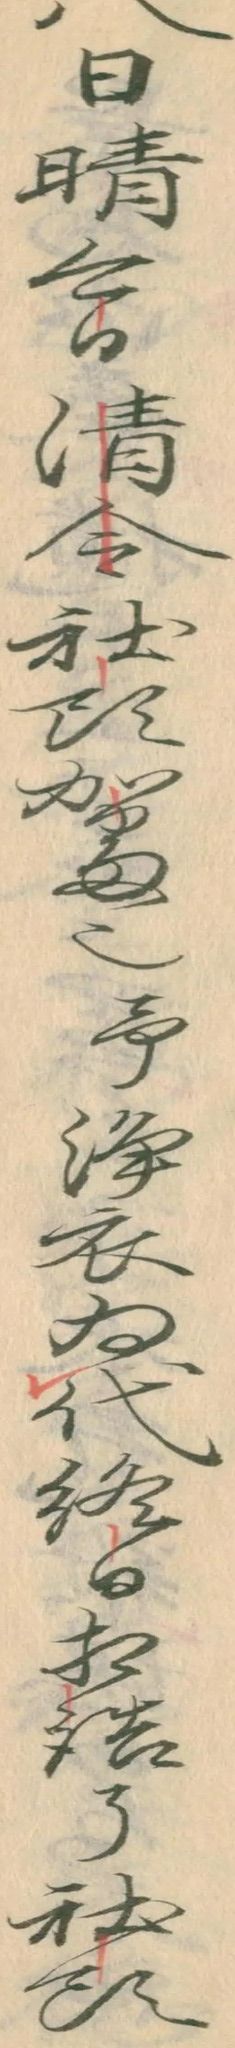八日晴今-日清令社-頭加-番也予浄衣為代終-日相_詰了社-頭
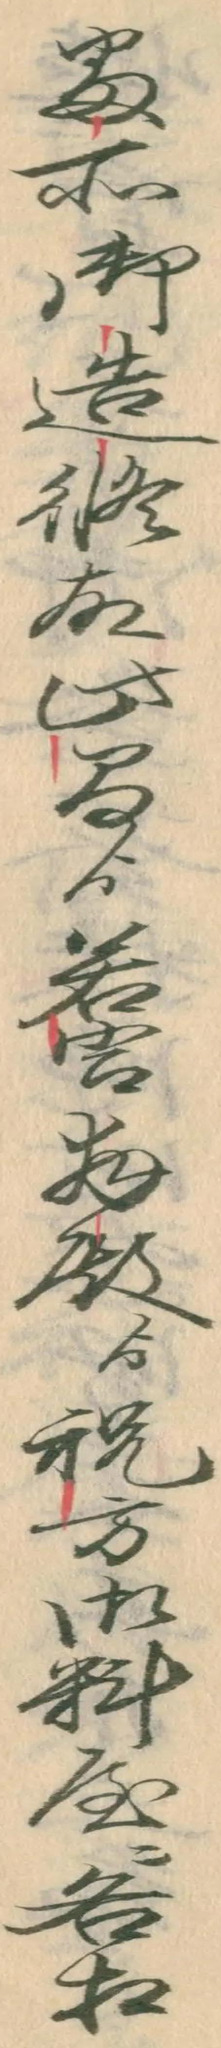番-所御-造-修故此_間ゟ若_宮拝-殿ゟ祝_方御料屋ニ各相
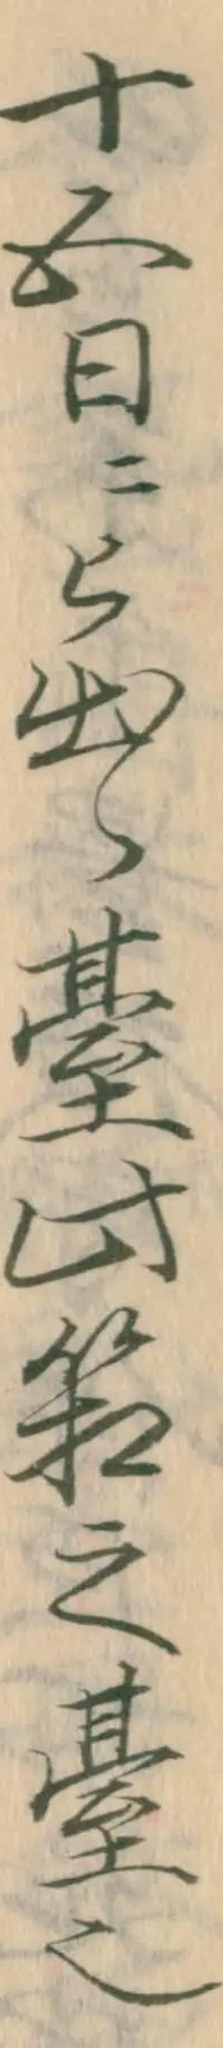十五日ニ被出候台此箱之台也
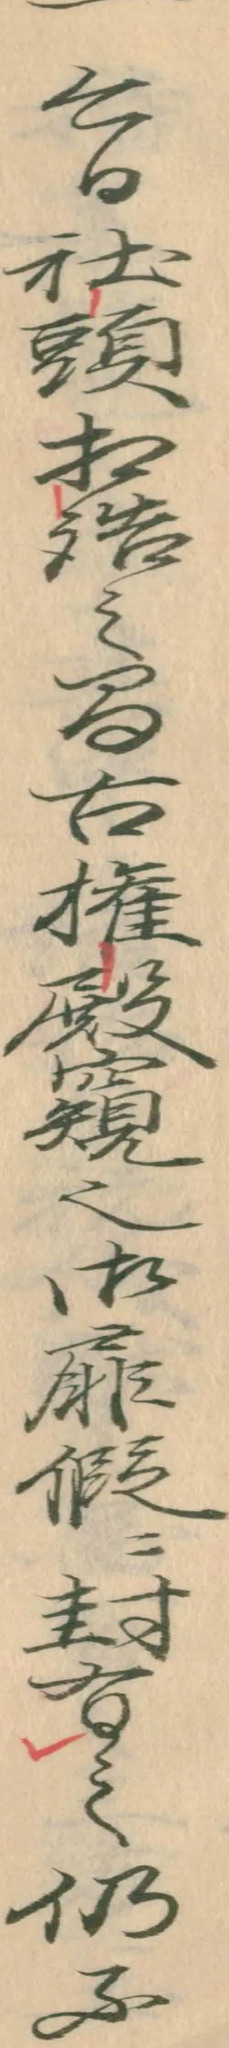一今日社-頭相_詰之間古権-殿窺也御扉仮ニ封有之仍不
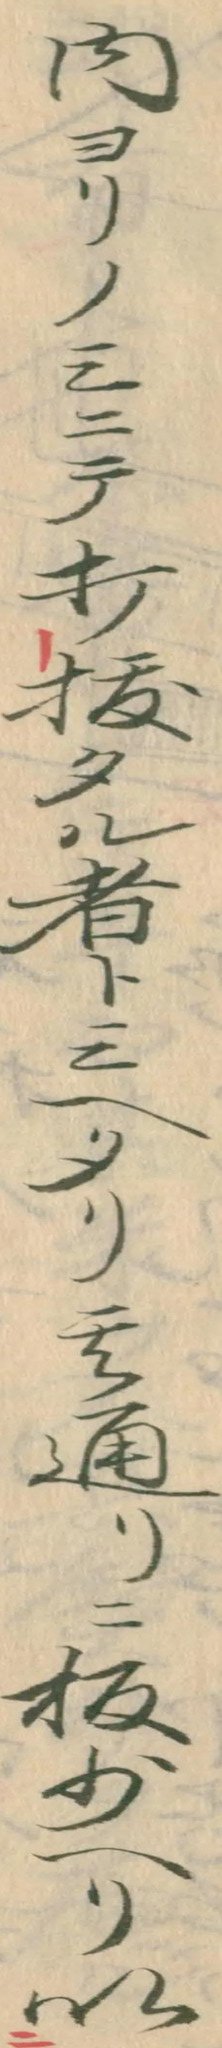内ヨリノミニテ打_抜タル者トミヘタリ其通リニ板少ヘリ以
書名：賀茂社記録. 第15冊
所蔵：国立国会図書館 National Diet Library, JAPAN
